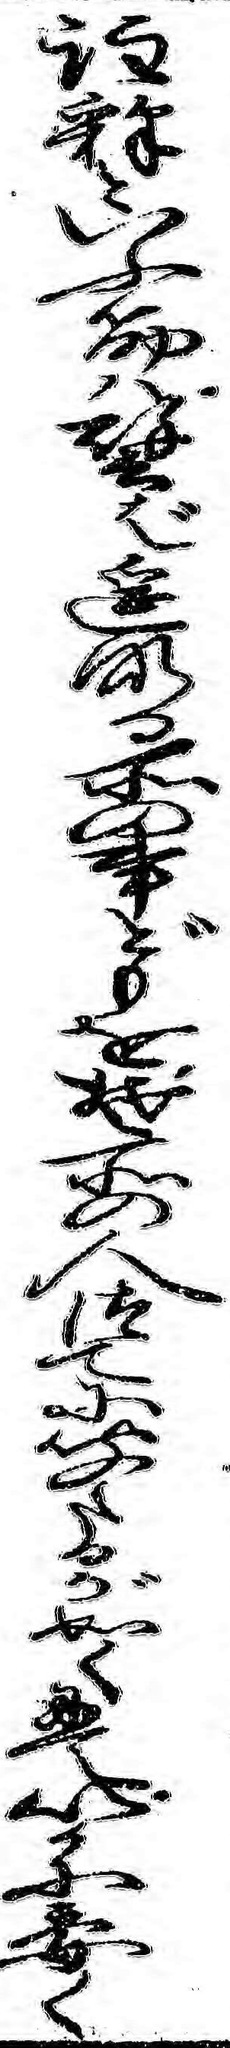註釈といふ筋は。譬えば遥なる所の事どもをそ所の人つてにかたるが如くに聞たるが如くえいかに委く
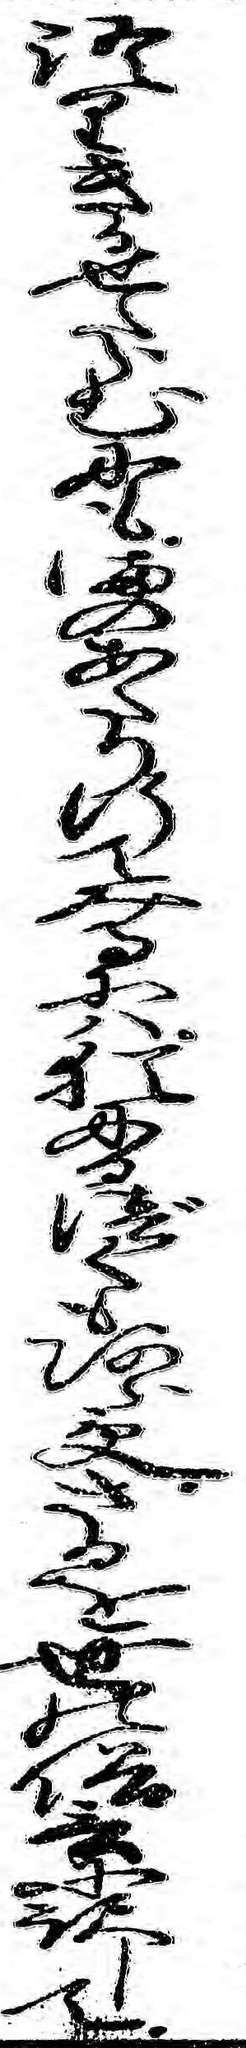語りきかせたらむにも。まのあたり行てみるには。猶にるべくもあらず。さるを世の俗言に訳して。
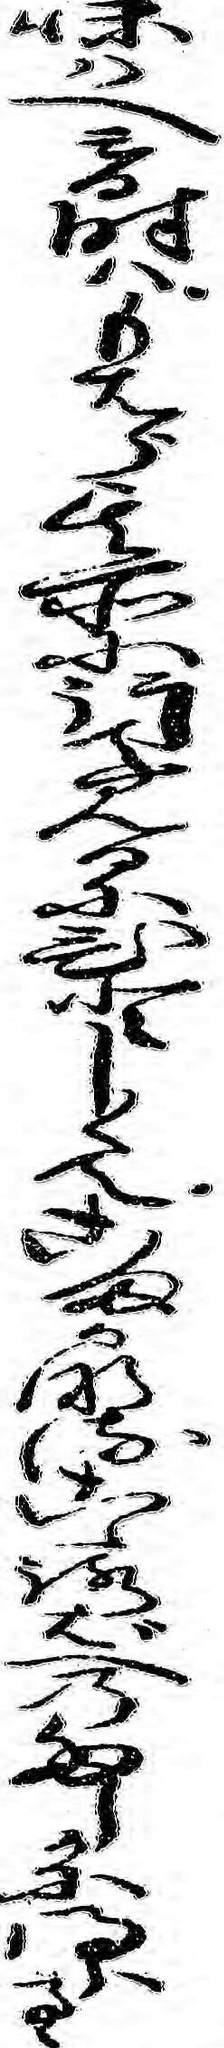味はへ云る時は。もはら其所に行て見るにひとしくて。こまかなるこゝろばへのたしかに侍らるゝ
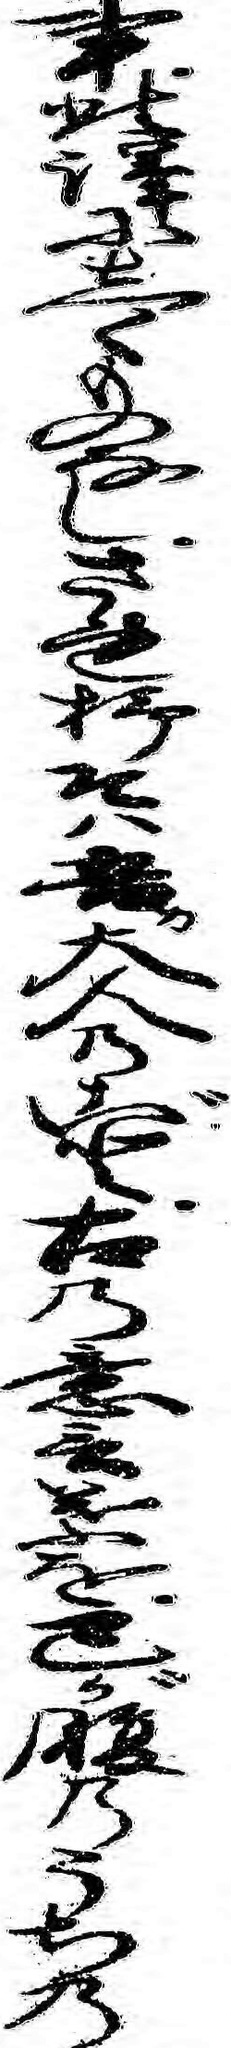事。此訳にしくものなし。されどそは吾大人のごと。古の意言葉を。己が腹のうちの

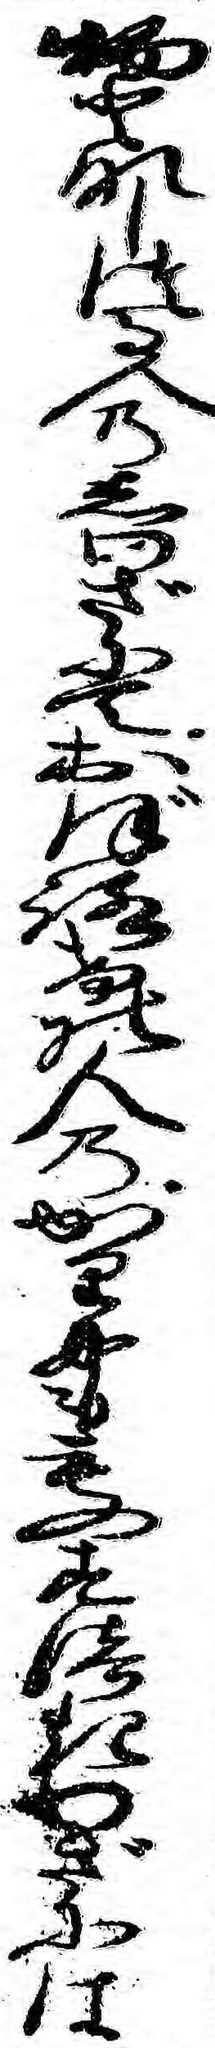物となしつる人のしわざにて。おぼろけの人の。かりにもものすべきわざには
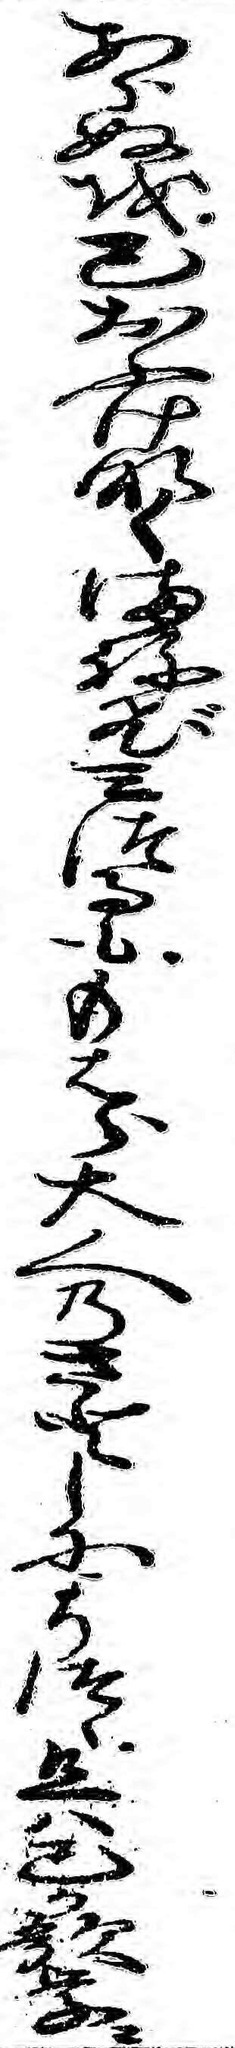あらぬを。己おふけなくまねびみつるも。もはら大人のさとしによりつく是は己が歌学に
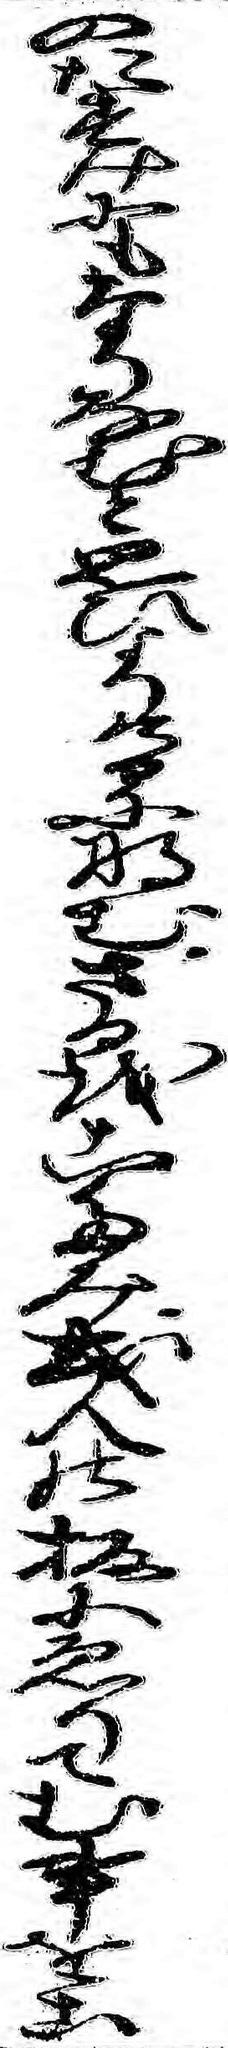のたすけにもなりなむと思ひよりけるになむ。さるをこたみ。或人の板にゑりてむ事をこ
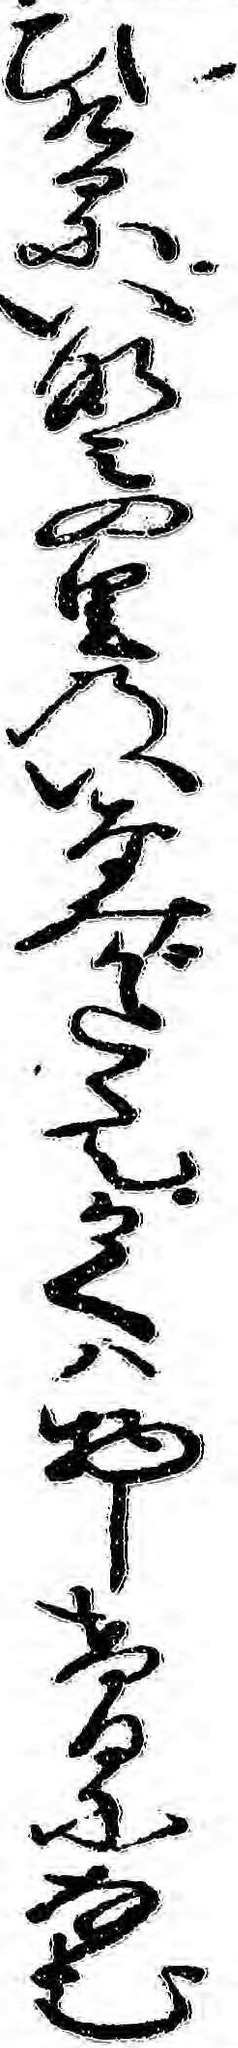ひけるに。いなみの里のいなみがたくて。かくは物しけるになむ
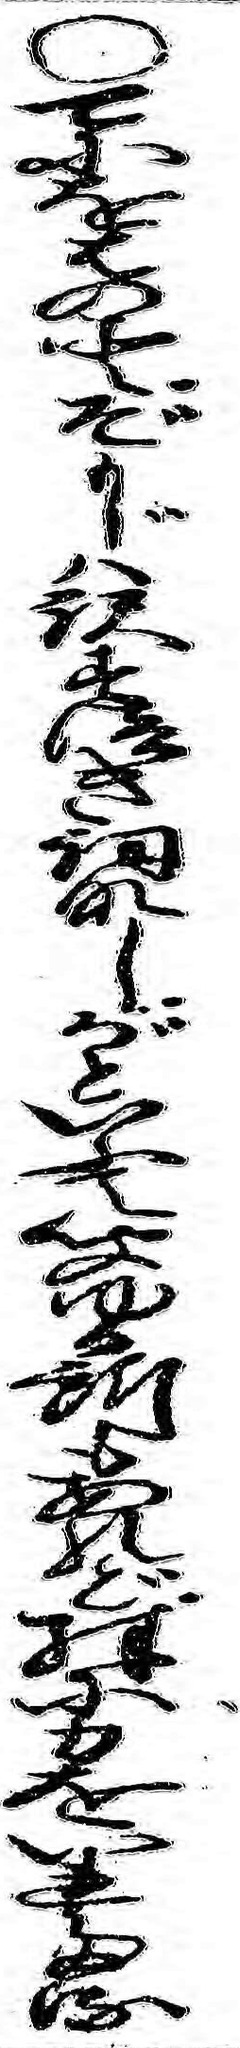◯てにをはのと。ぞもじは訳すべき詞なし。がといふて聞ゆる所もあれど。殊に力を入れたる
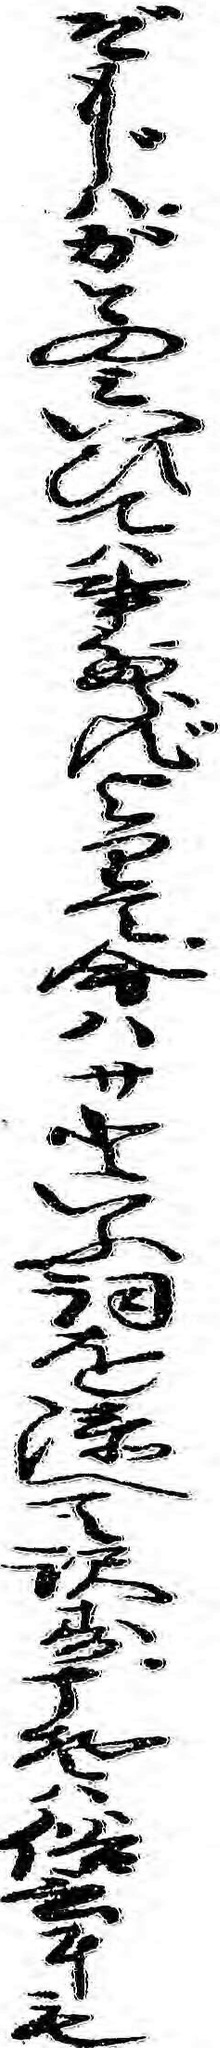ぞもじは。がとのみいひては事たらずよりて。今はサといふ詞を添へて訳す。こそは俗言にも
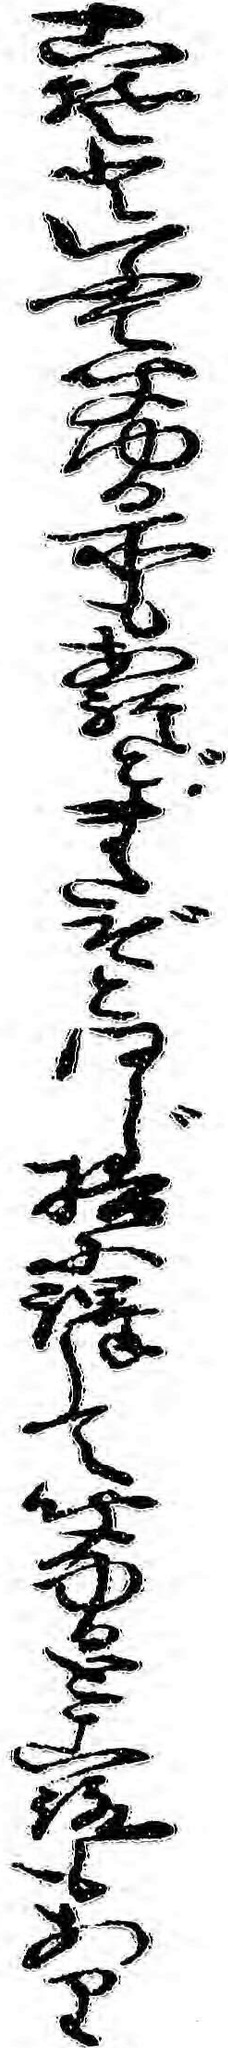こそといふて聞ゆる所もあれど。またぞと同じ様に訳して聞ゆるところもあり。
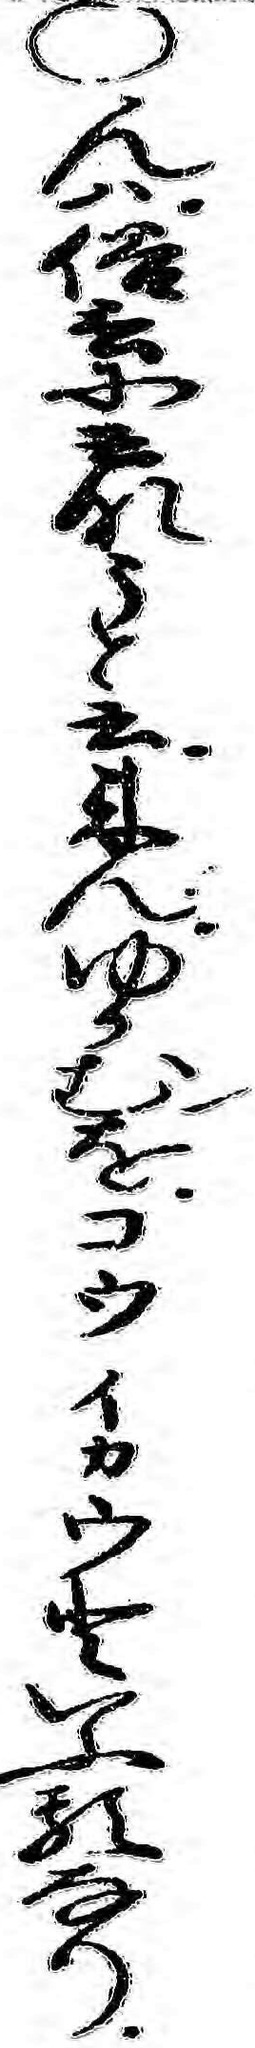◯んは。俗言にみなうと云。来ん。ゆかむを。コウイカウといふ類なり。
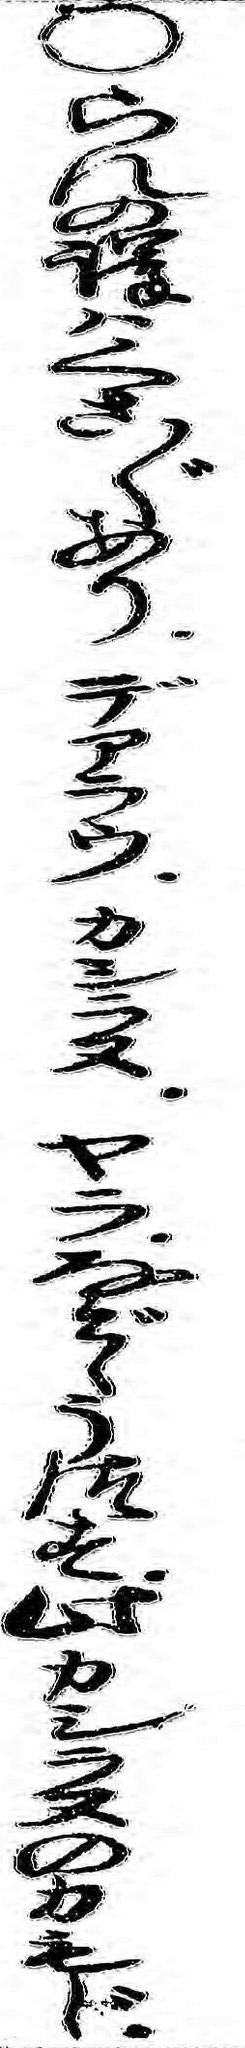◯らんの訳はくさ〴〵あり。デアラウ。カシラヌ。ヤラ。などゝうつす。此カシラヌ。のカもじ。
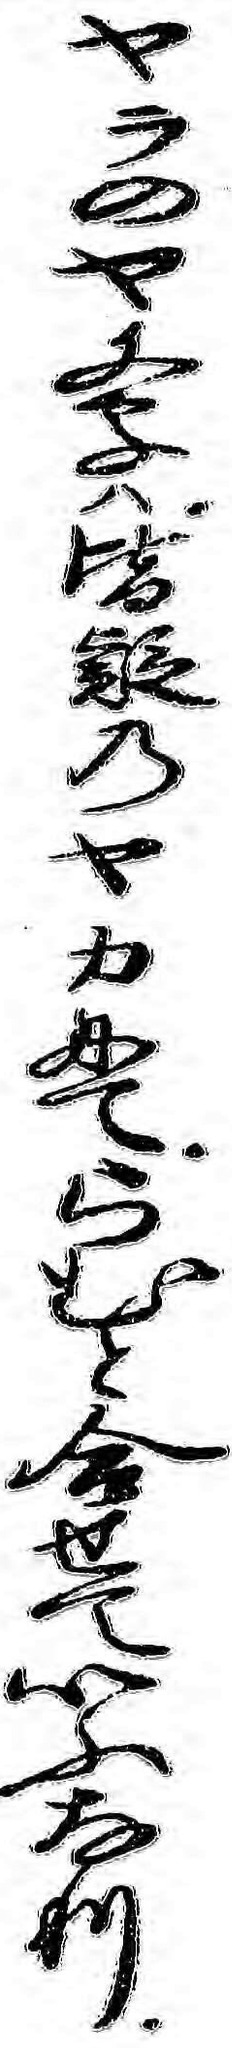ヤラのヤ文字は。皆疑のヤカにて。らむと合せていふなり。
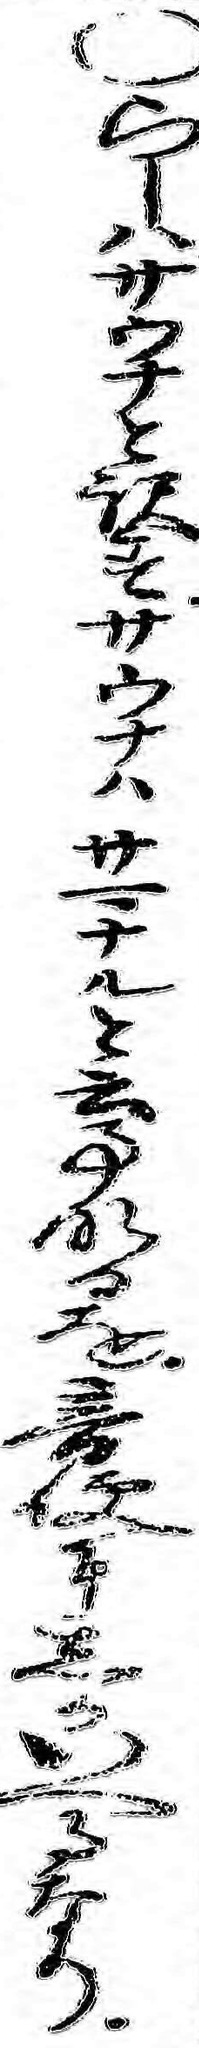◯らしは。サウナと訳す。サウナはサマナルと云事なるを。音便にしかいへるなり。
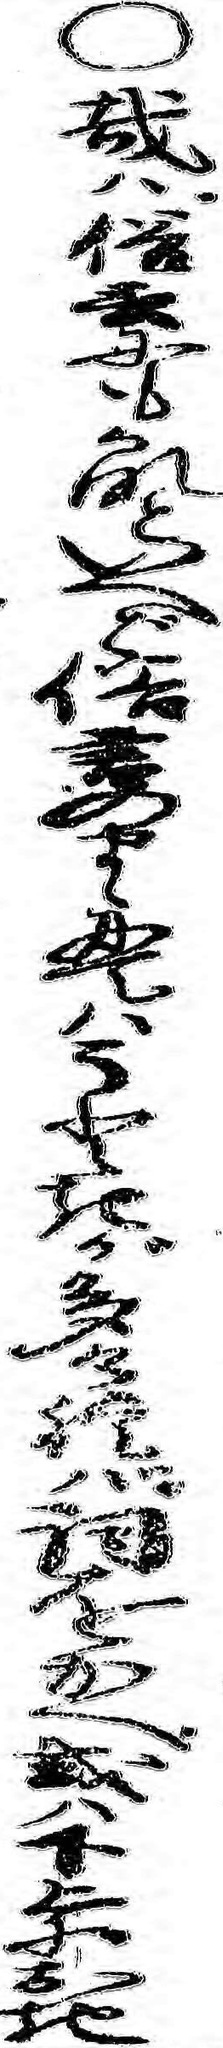◯哉は。俗言にもかなといへば俗言のまゝにてはうときが多ければ。詞をかへ。あるいは下上におき
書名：百人一首／小倉の山ふみ
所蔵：国文学研究資料館
